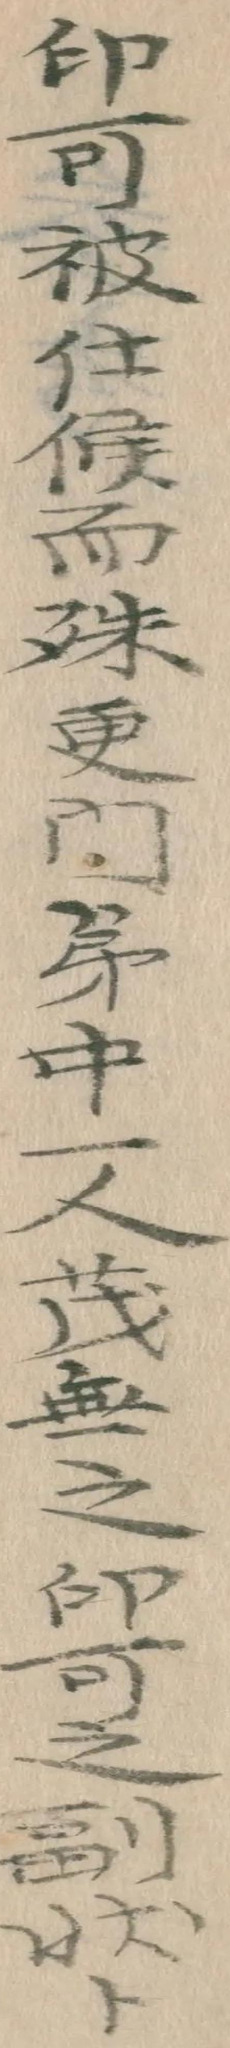印可被仕テ殊更門弟中一人モ無之印可之副状ト
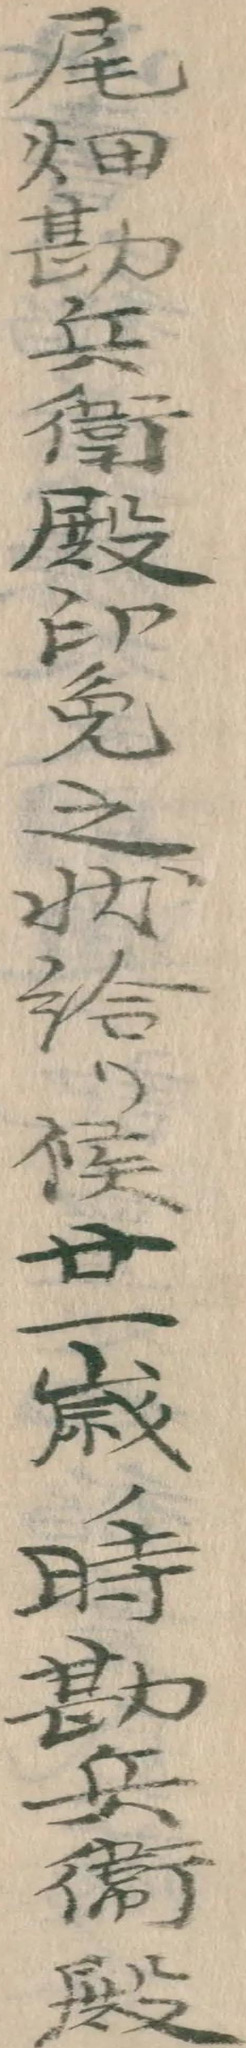尾畑勘兵衞殿印免之状給リ候廿一歳ノ時勘兵衞殿
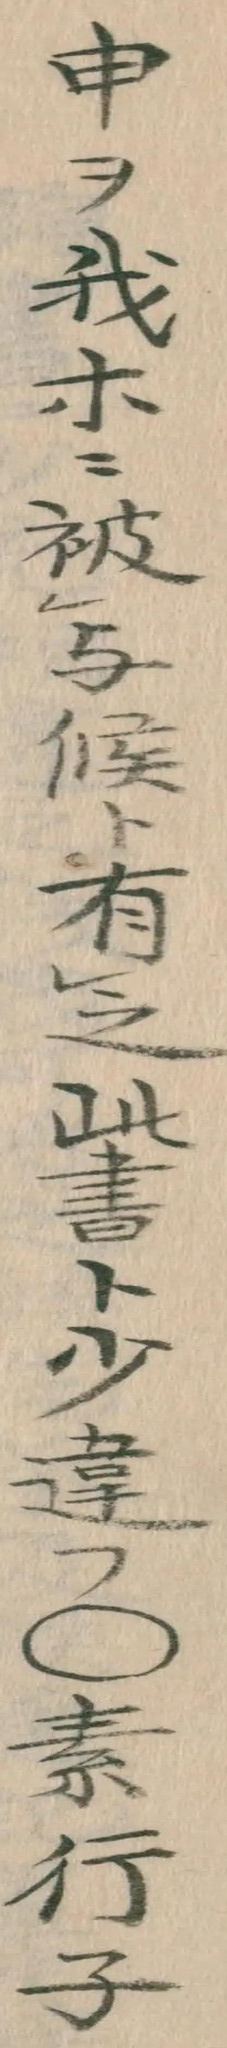申ヲ我等ニ被与候ト有之此書ト少違フ○素行子
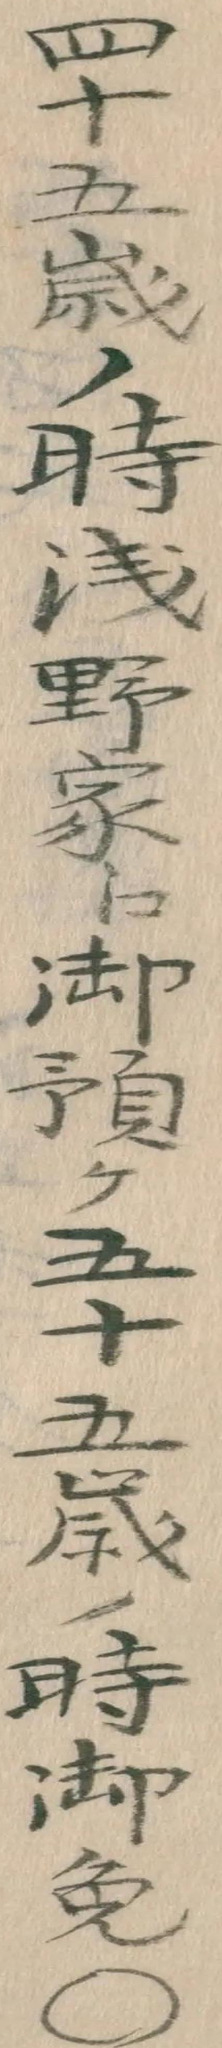四十五歳ノ時淺野家エ御預ケ五十五歳ノ時御免○
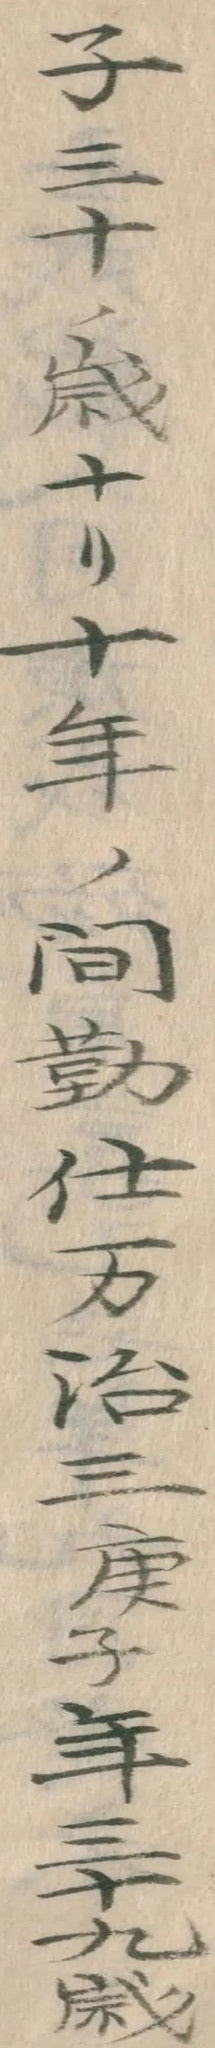子三十ノ歳ナリ十年ノ間勤仕万治三庚子年三十九歳
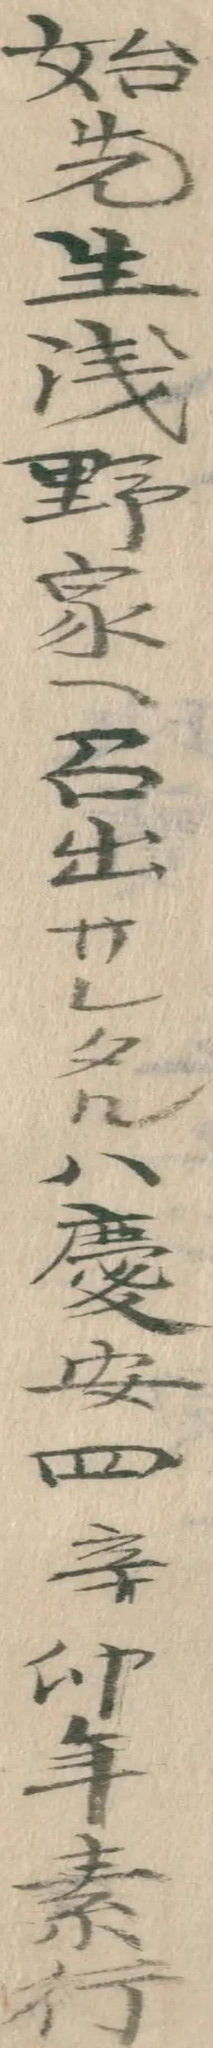始先生淺野家ヘ召出サレタルハ慶安四辛卯年素行
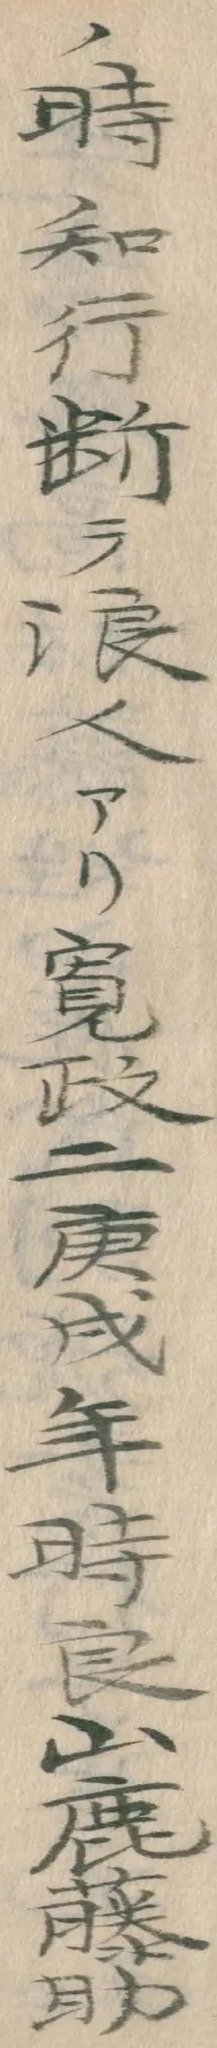ノ時知行断テ浪人アリ寛政二庚戌年時良山鹿藤助
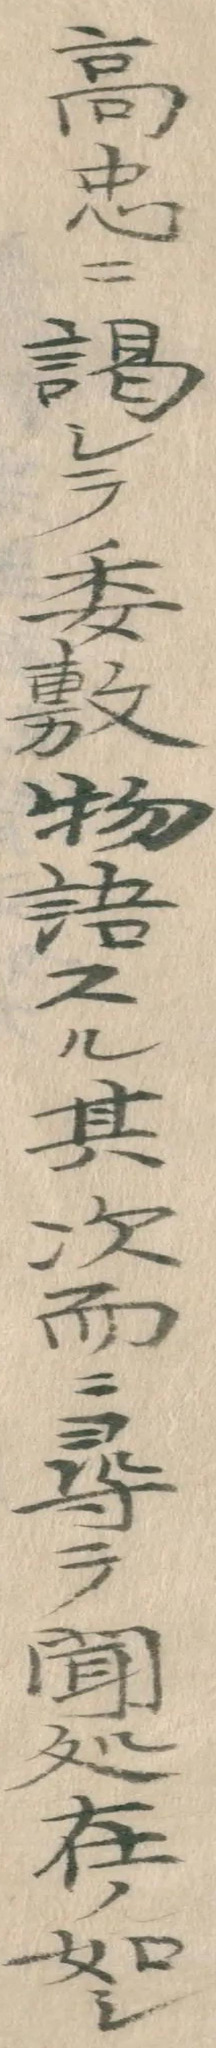高忠ニ謁シテ委敷物語スル其次而ニ尋テ聞処在ノ如シ
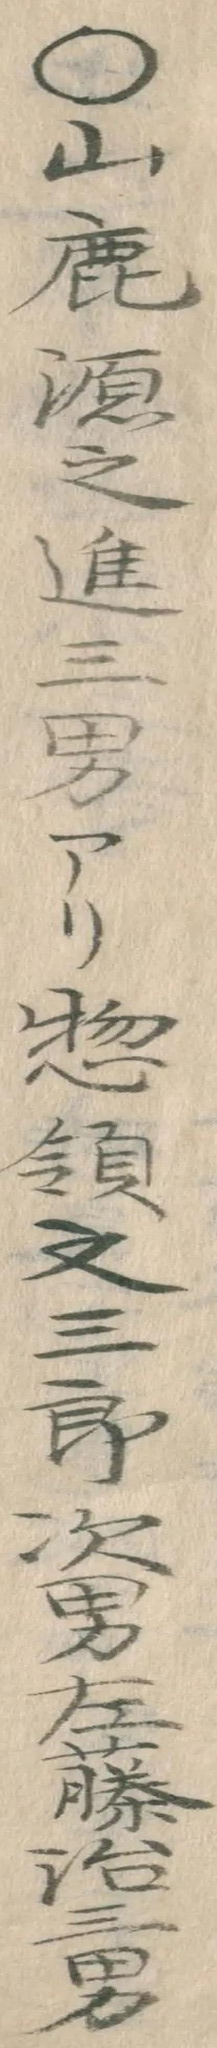○山鹿源之進三男アリ惣領文三郎次男左藤治三男
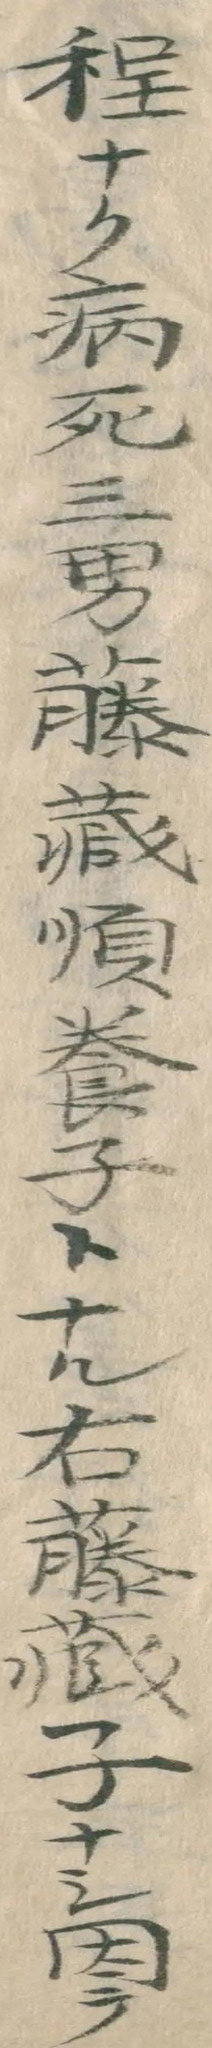程ナク病死三男藤蔵順養子トナル右藤蔵子ナシ因テ
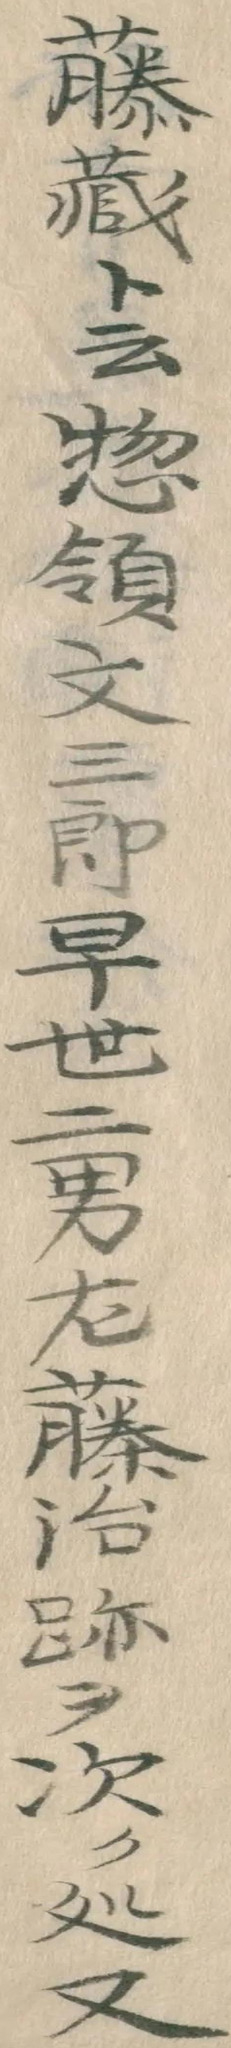藤蔵ト云惣領文三郎早世二男左藤治跡ヲ次ク処又

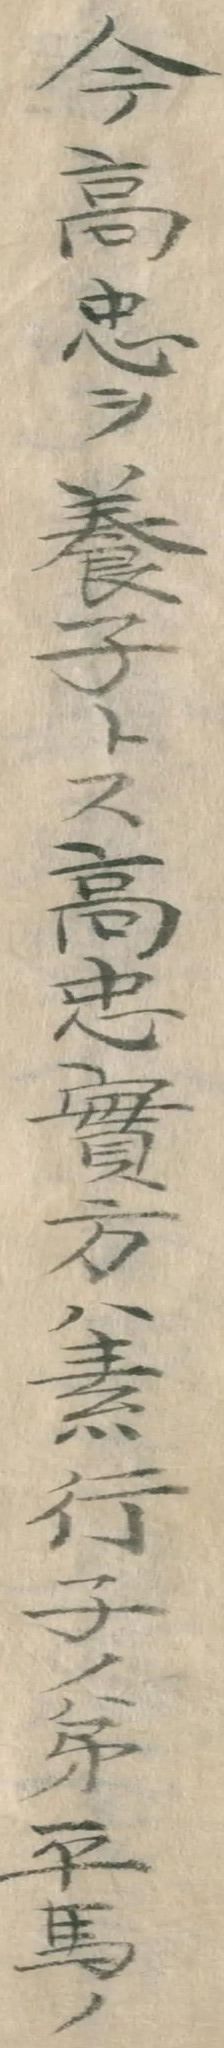今高忠ヲ養子トス高忠実方ハ素行子ノ弟平馬ノ
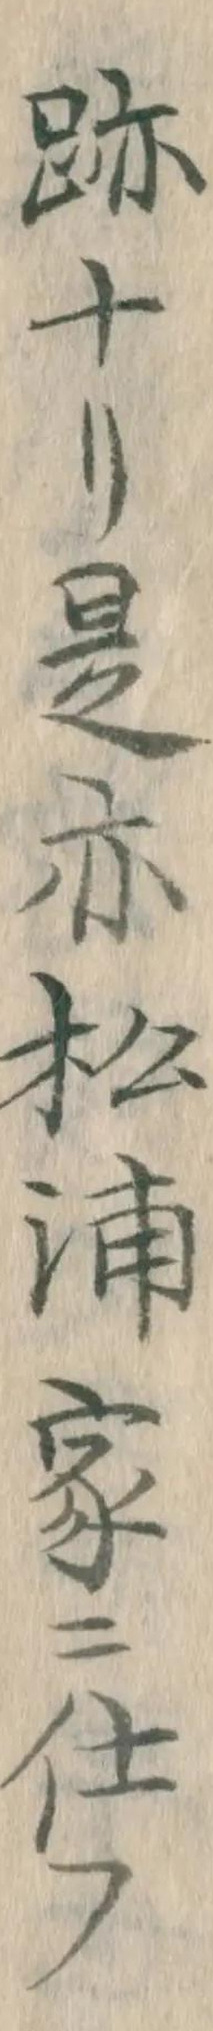跡ナリ是亦松浦家ニ仕フ
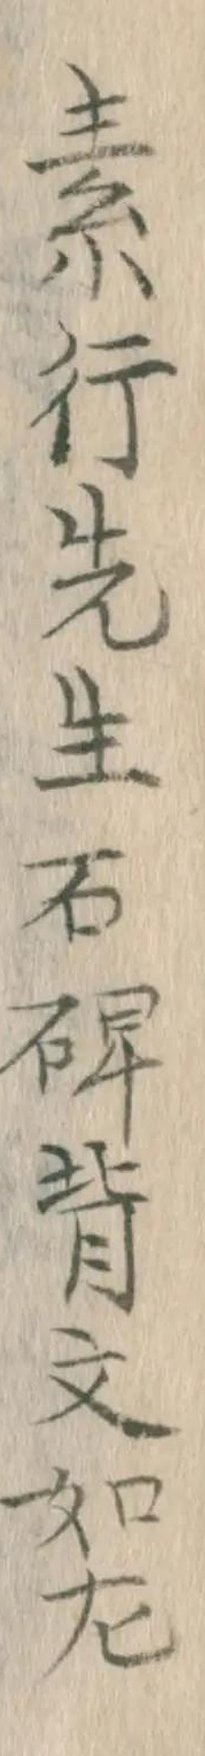素行先生石碑背文如左
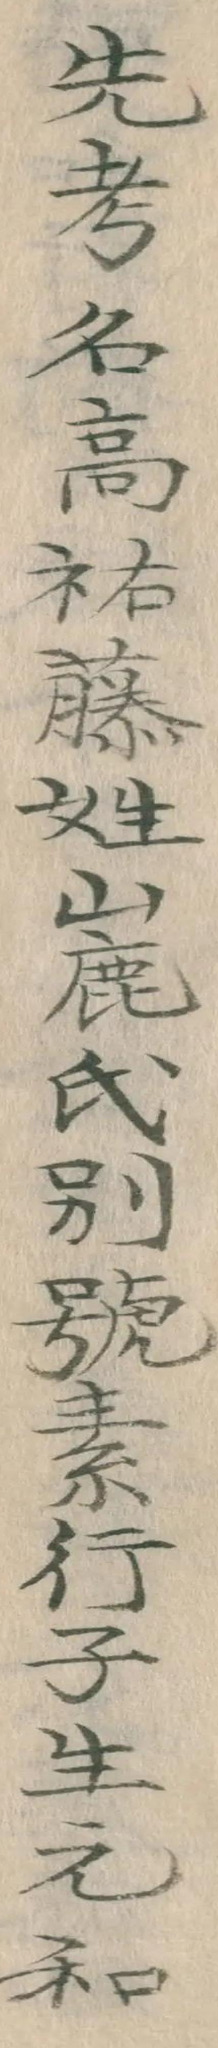先考名高祐藤姓山鹿氏別號素行子元和
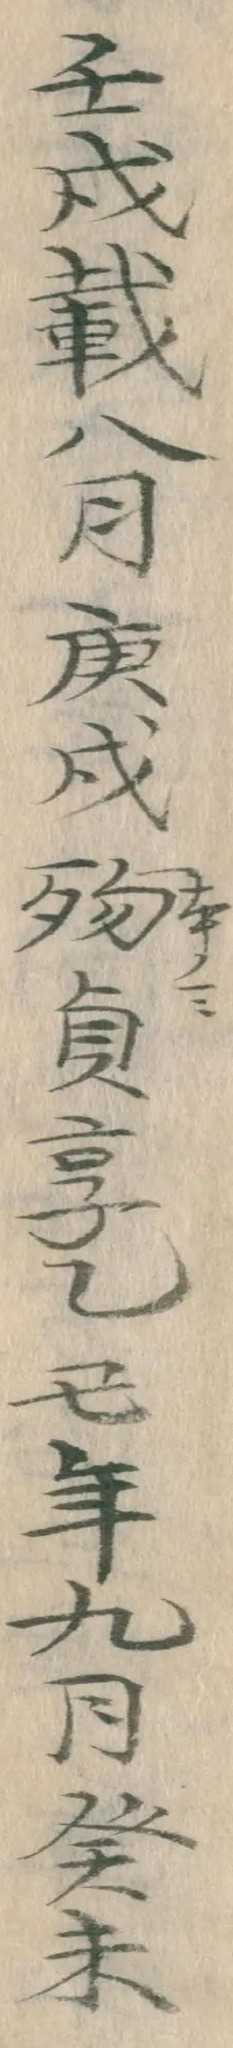壬戌載八月庚戌歾貞享乙丑年九月癸未
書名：輪池叢書. 12
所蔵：国立国会図書館 National Diet Library, JAPAN
